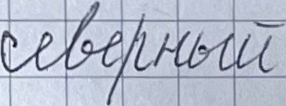северный
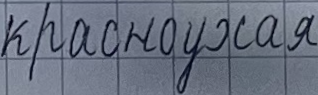красноухая
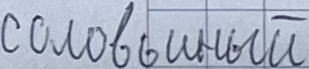соловьиный
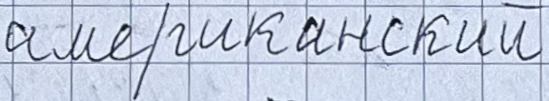американский
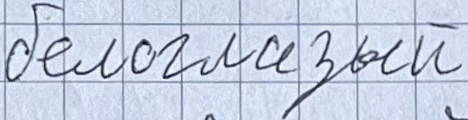белоглазый
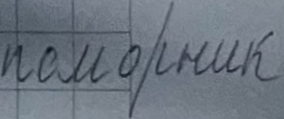поморник
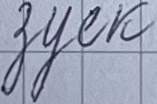зуек
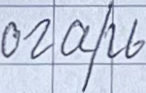огарь
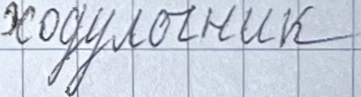ходулочник
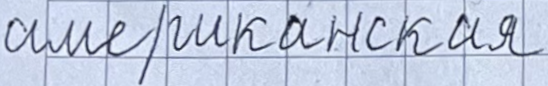американская
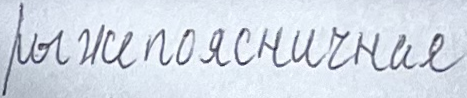рыжепоясничная
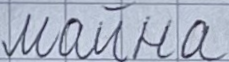майна
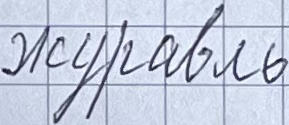журавль
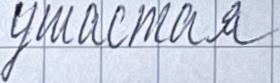ушастая
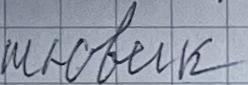тювик
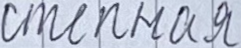степная
